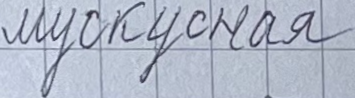мускусная
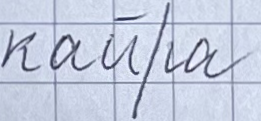кайра
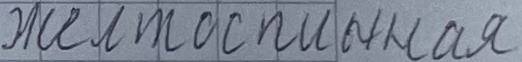желтоспинная
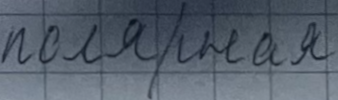полярная
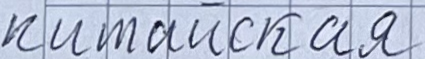китайская
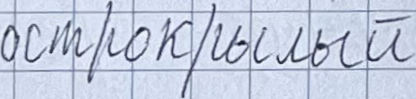острокрылый
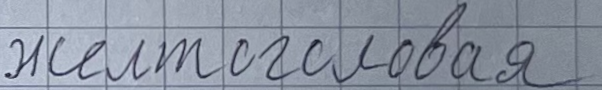желтоголовая
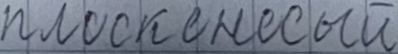плосконосый
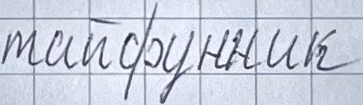тайфунник
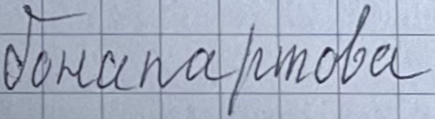бонапартова
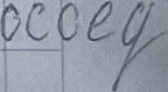осоед
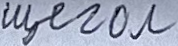щегол
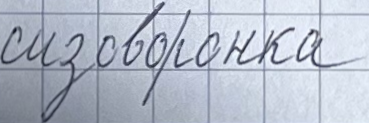сизоворонка
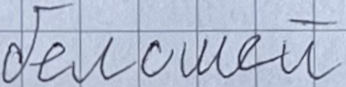белошей
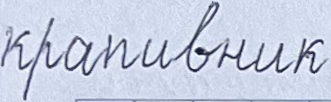крапивник
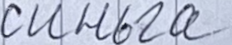синьга
